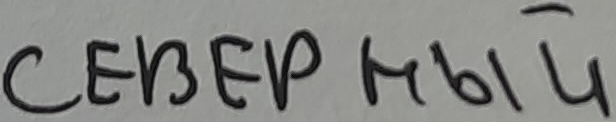северный
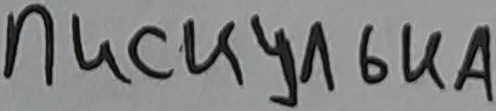пискулька
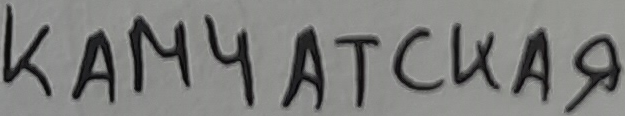камчатская
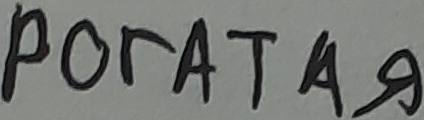рогатая
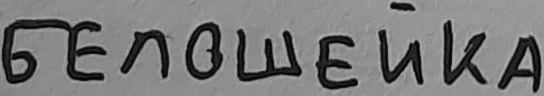белошейка
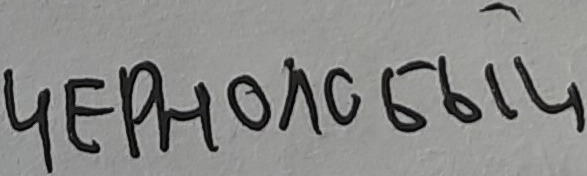чернолобый
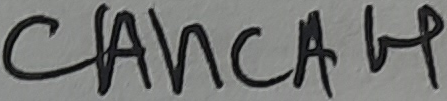сапсан
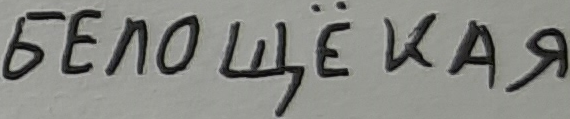белощёкая
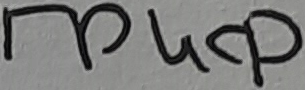гриф
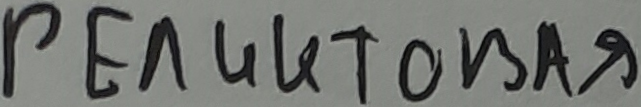реликтовая
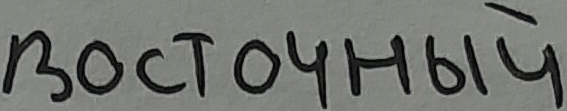восточный
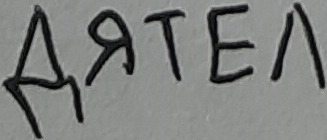дятел
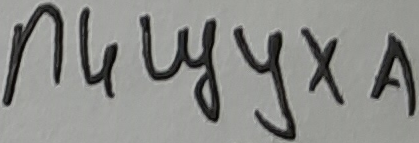пищуха
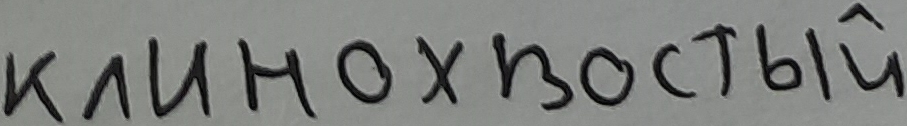клинохвостый
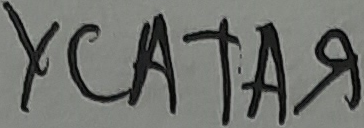усатая
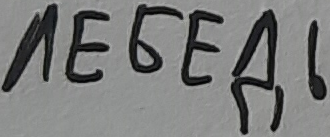лебедь
